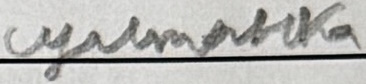султанка
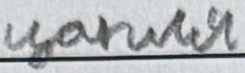цапля
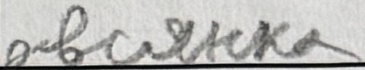овсянка
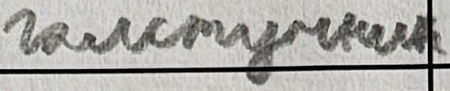галстучник
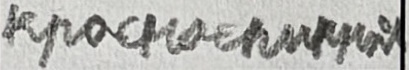красноспинная
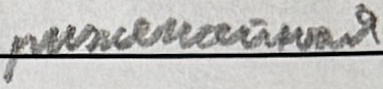рыжешейная
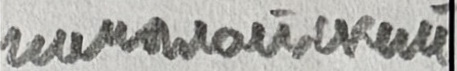гималойский
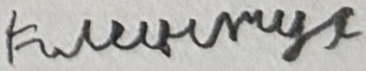клинтух
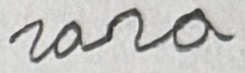гага
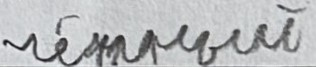чётный
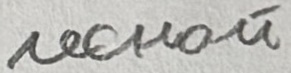лесной
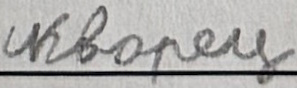скворец
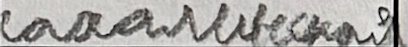сахалинская
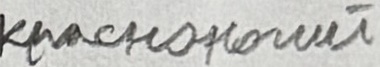красноногий
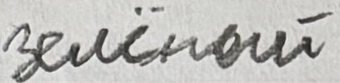зелёный
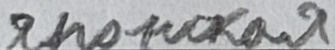японская
